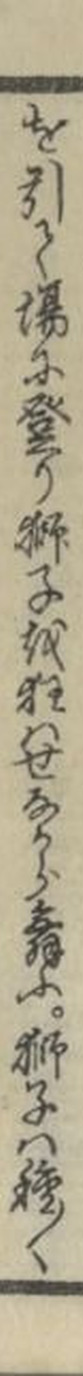を引て場に登り獅子を狂はせなから舞ふ。獅子は種〳〵
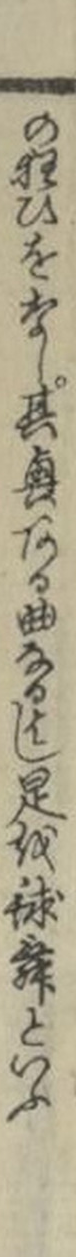の狂ひをなし。其興ある曲なるはし是を毬舞といふ
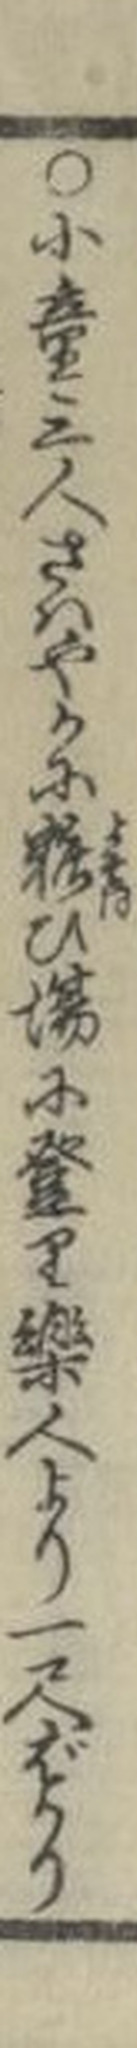○小童三人さはやかに粧ひ場に登り楽人より一尺ばかり
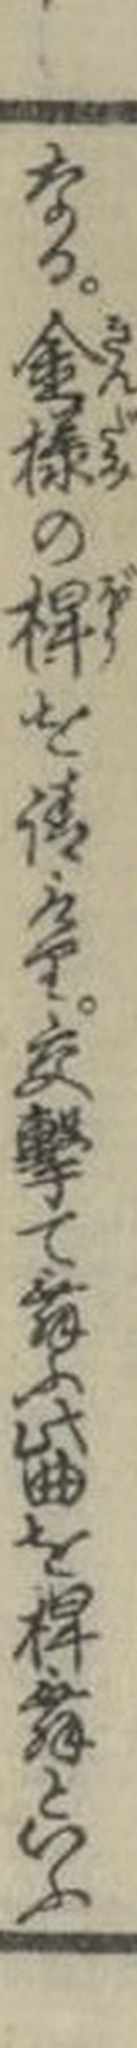なる。金様の桿を請けり。交撃て舞ふ此曲を桿舞といふ
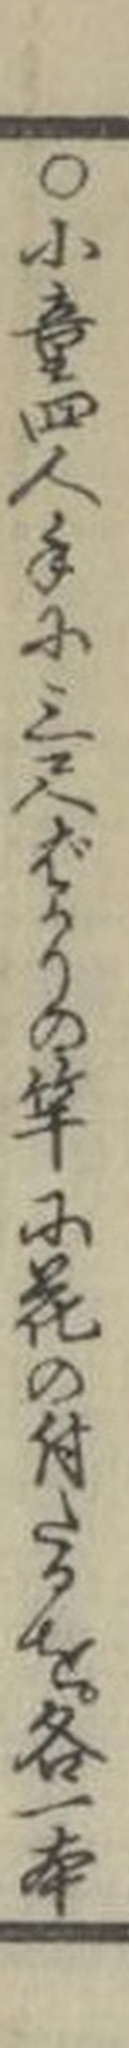○小童四人手に三尺ばかりの竿に花の付たるを。各一本
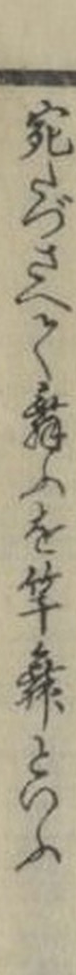宛たづさへ舞ふを竿舞といふ
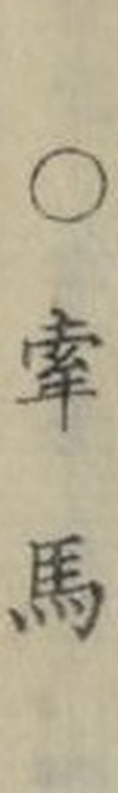○索馬

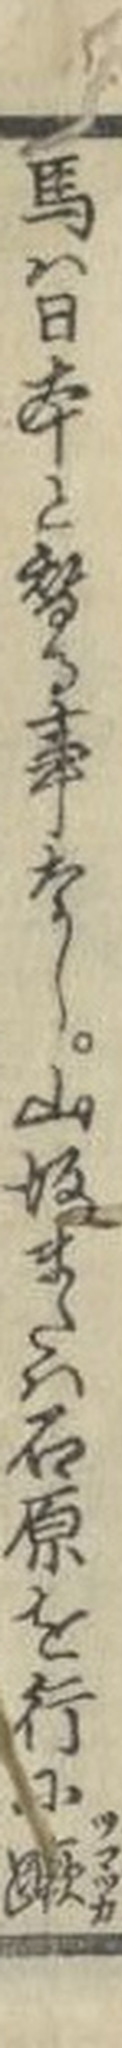馬は日本と替る事なし。山坂または石原を行に蹶
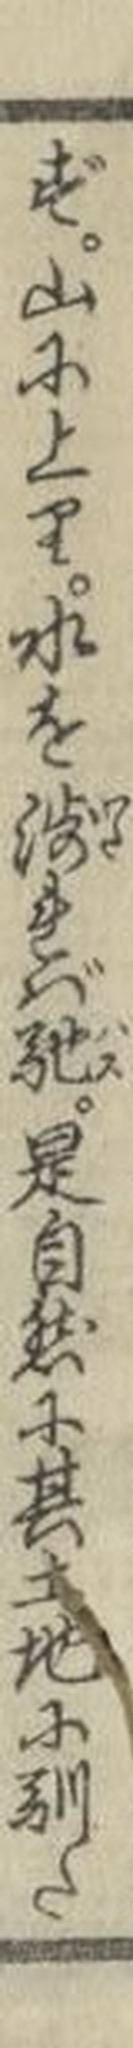ず。山に上り。水を渉れば馳。是自然に其土地に馴た
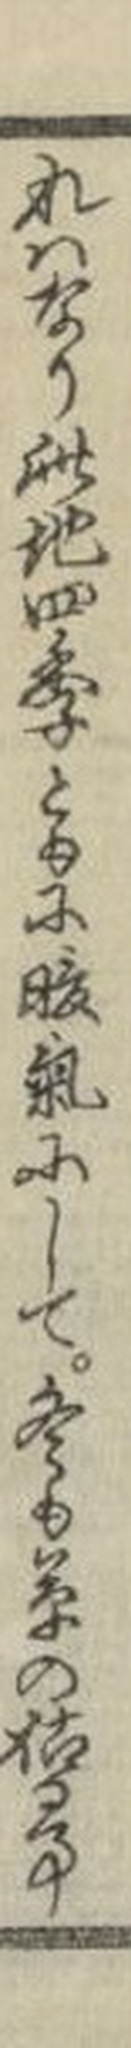れはなり此地四季ともに暖気にして。冬も草の枯る事
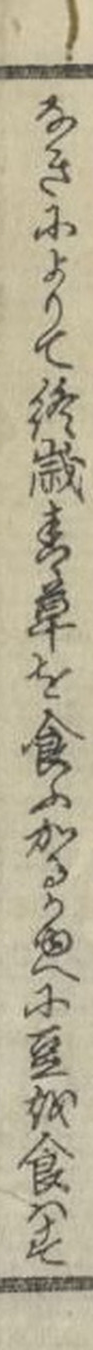なきによりて終歳春草を食ふかるかゆへに豆を食はす
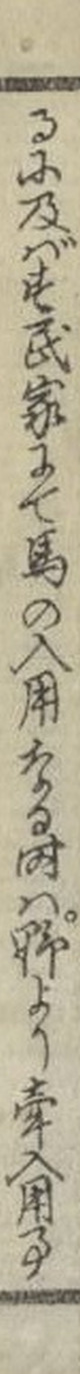るに及ばす民家にて馬の入用なる時は。野より牽入用事
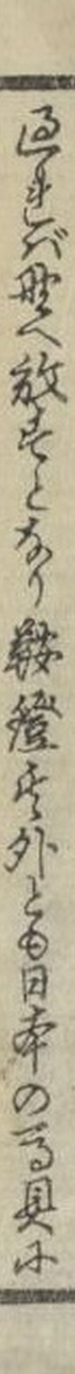過れば野へ放すとなり鞍鐙其外とも日本の馬具に
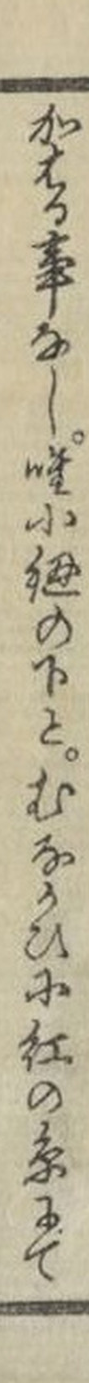かはる事なし。唯小紐の下と。むなかひに紅の糸にて
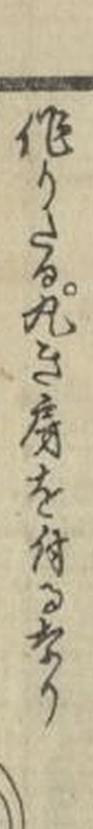作りたる。丸き房を付るなり
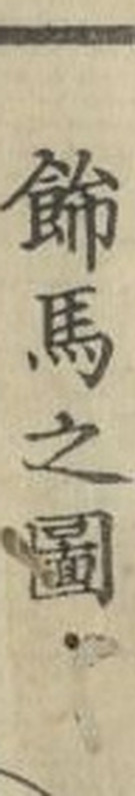飾馬之図
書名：琉球解語
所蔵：University of the Ryukyus Library
